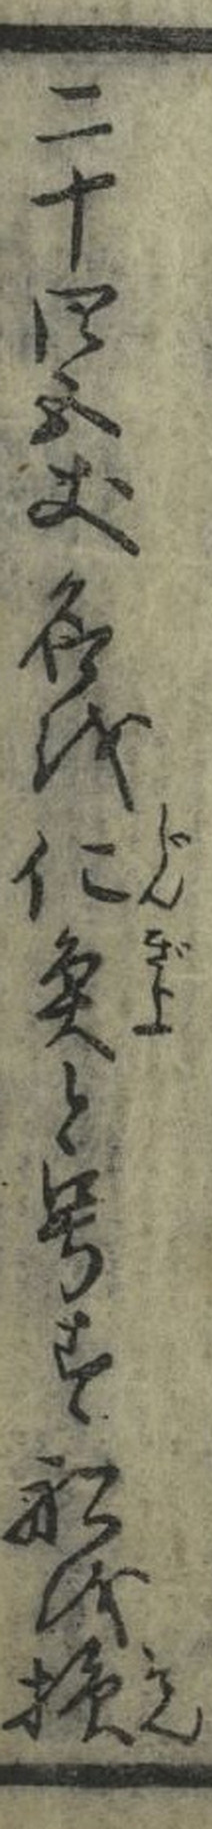二十四五丈名を仁魚と号す船を損

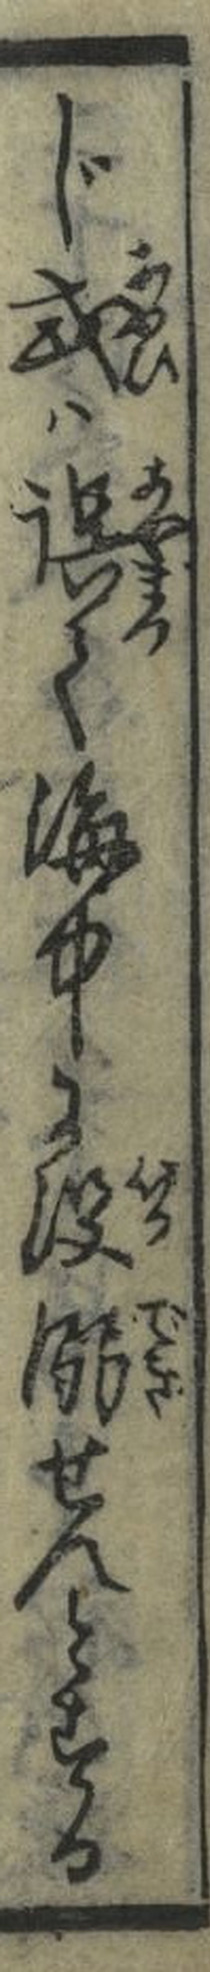じ或は過て海中に没溺せんとする
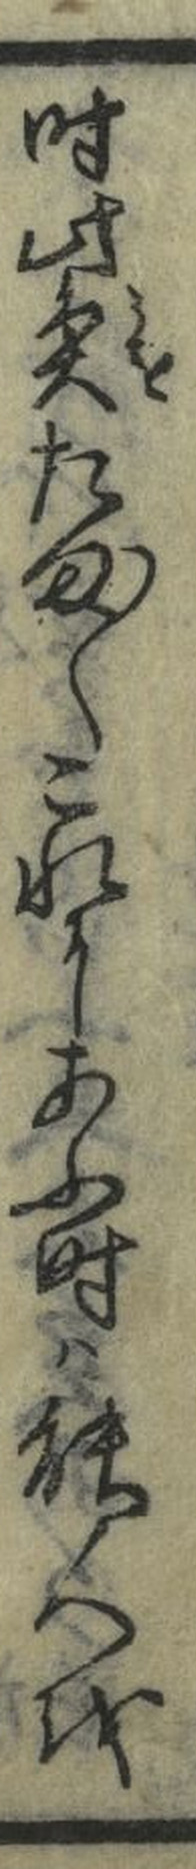時此魚たま〳〵これにあふ時は能人を
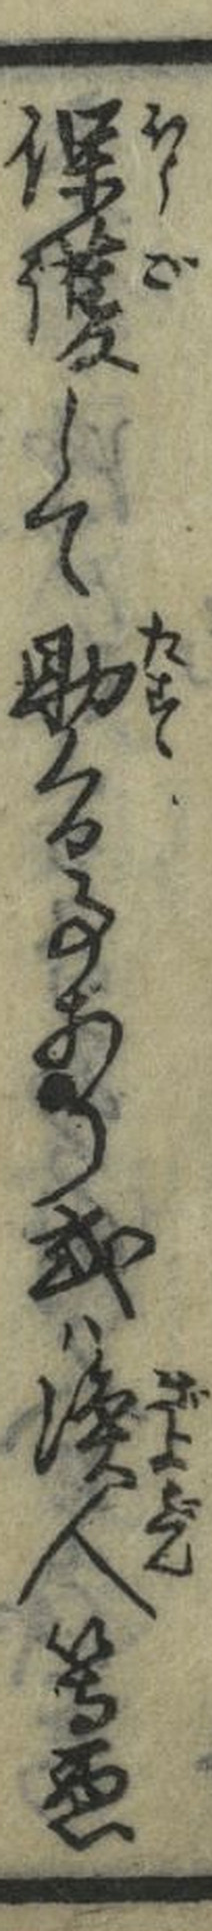保護して助くる事あり或は漁人等悪
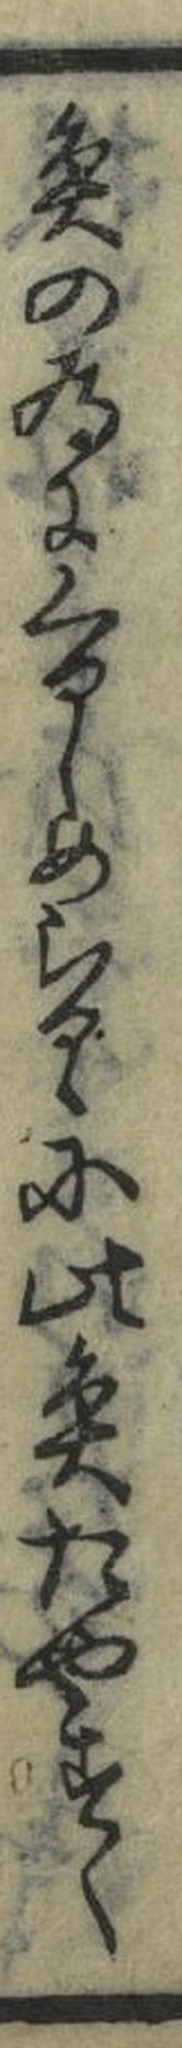魚の為にくるしめらるゝに此魚たやすく
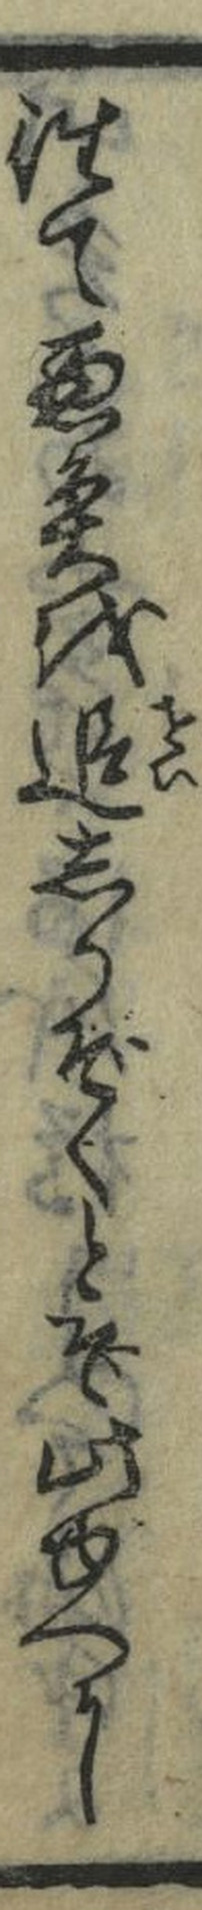往て悪魚を追しりぞくとぞこ此ゆへに
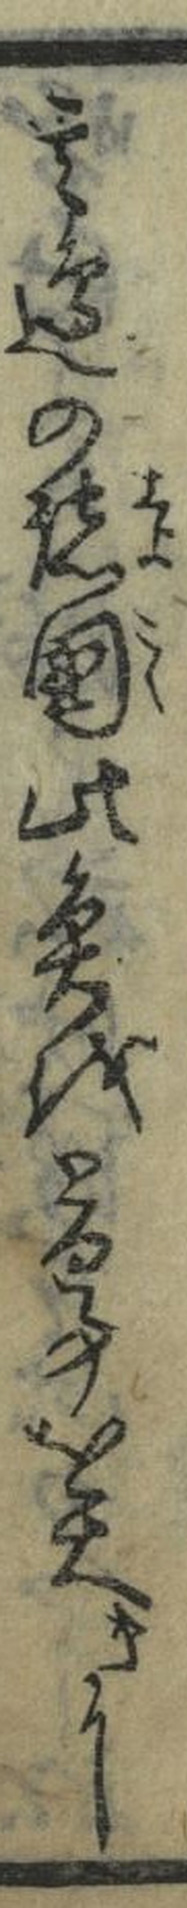其辺の諸国此魚をとる事を大きに
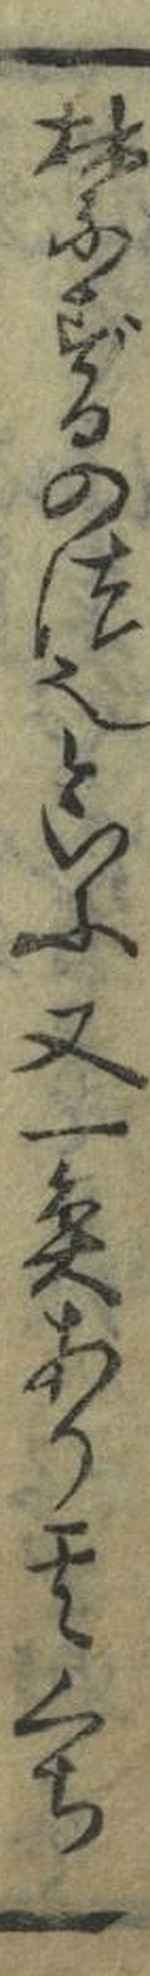禁ずるの法也といふ又一魚あり其くち
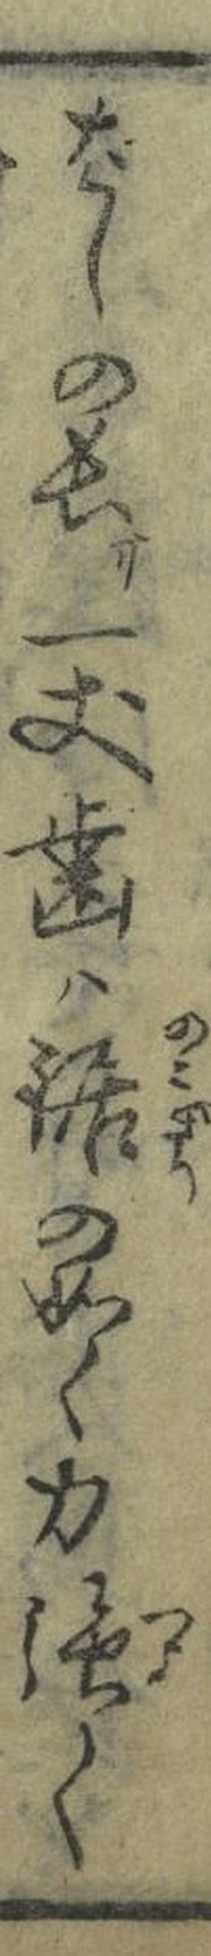ばしの長さ一丈歯は鋸の如く力強く
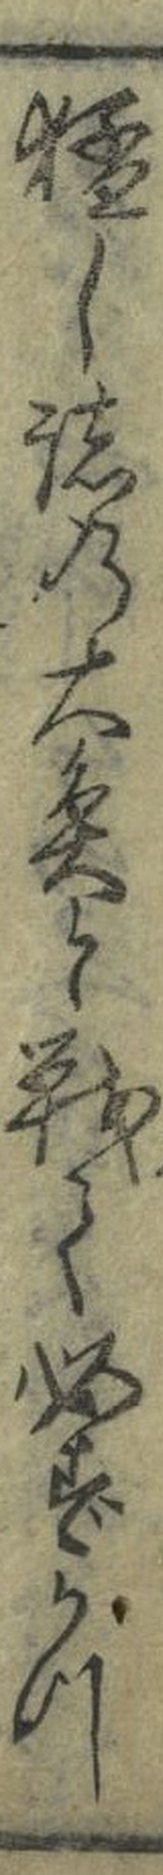猛し諸の大魚と戦て必ずかつ
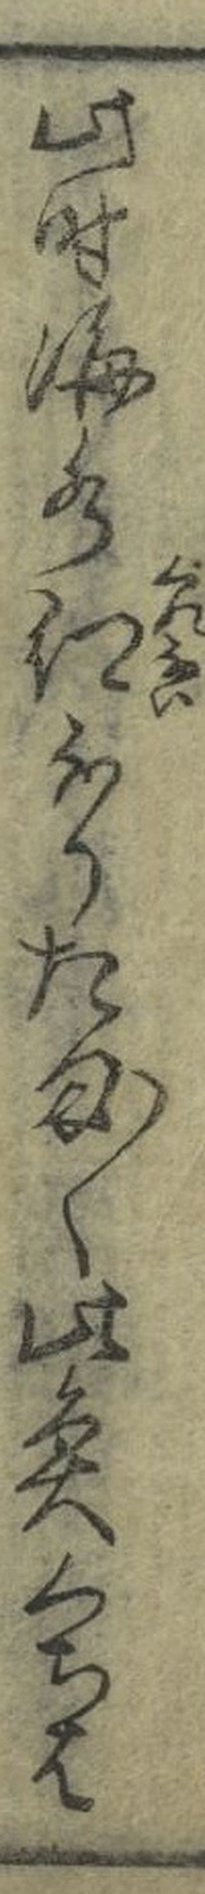此時海水紅なりたま〳〵此魚くちは
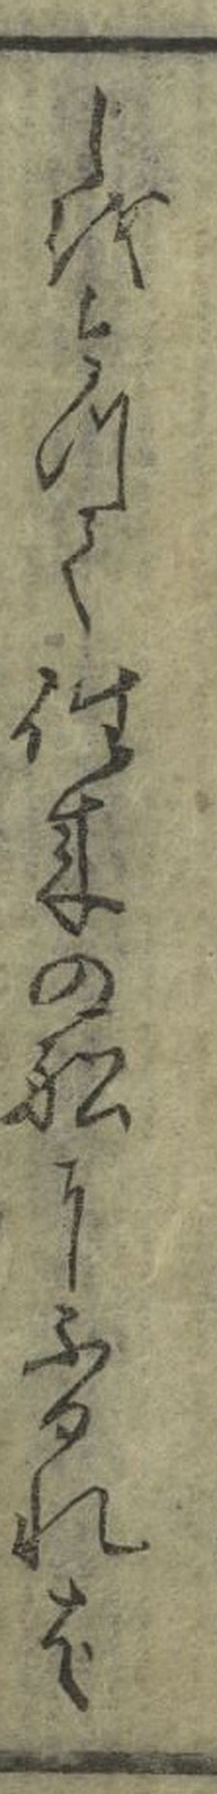しをすつて往来の船にふるれば
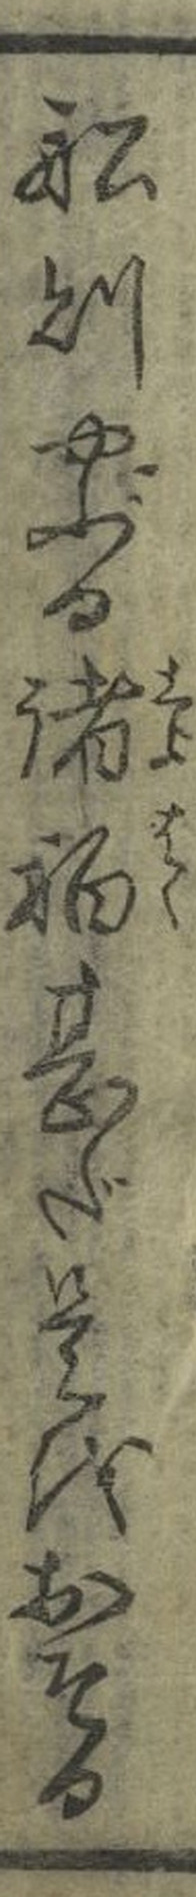船則やぶる諸舶甚だ是をおそる

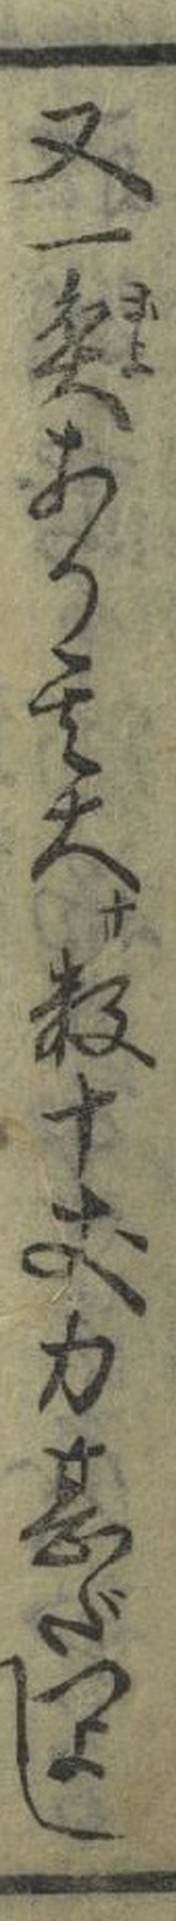又一魚あり其大さ数十丈力甚だつよし
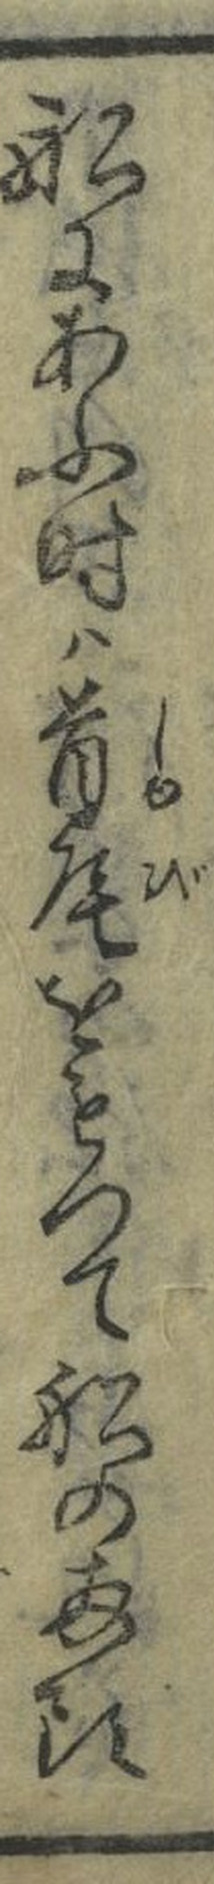船にあふ時は首尾をもつて船の両頭
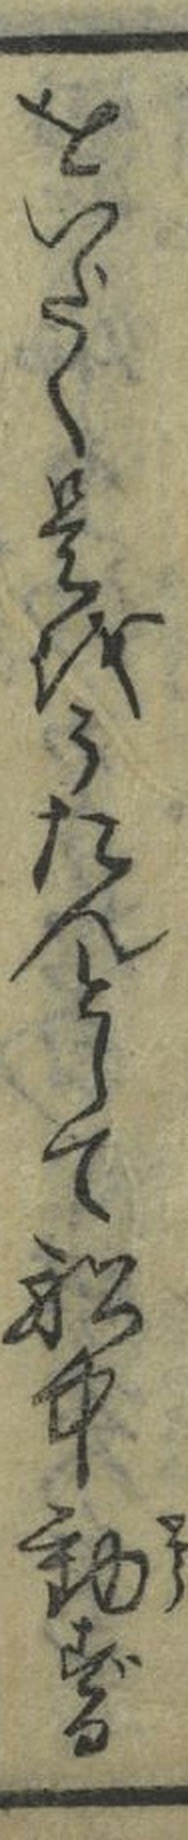をいだく是をうたんとして船中動ずる
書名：琉球雑話
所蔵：University of the Ryukyus Library
